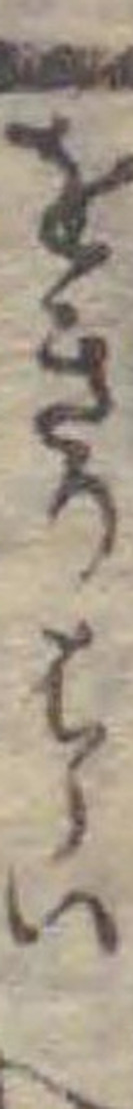をきりはらい
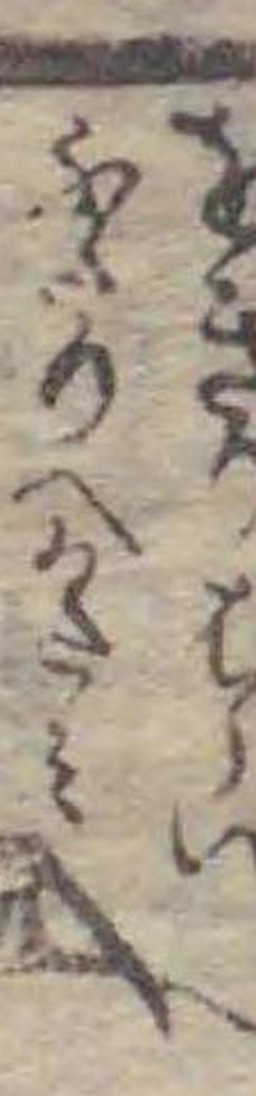ふたりへかたみ
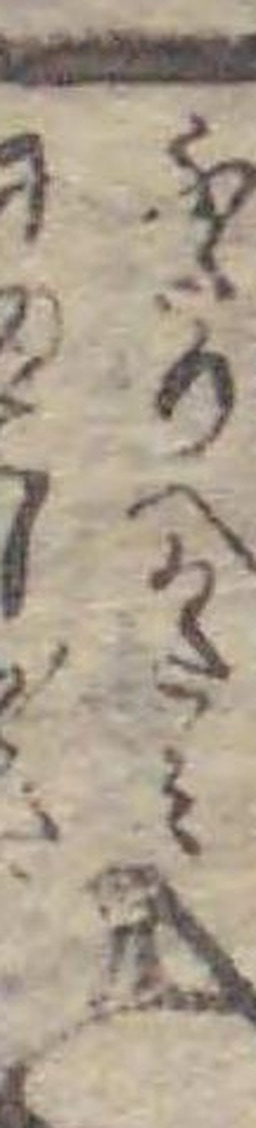にのこしおき
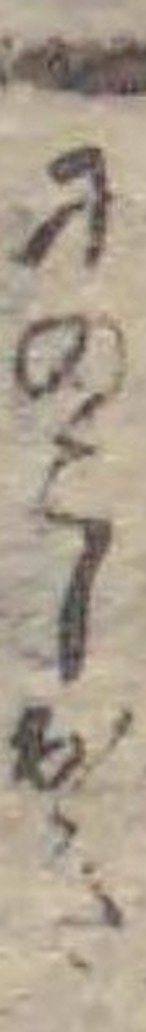にのこしおき
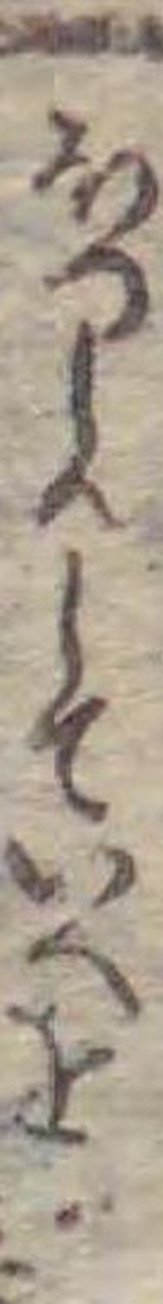ほつしんしていへを
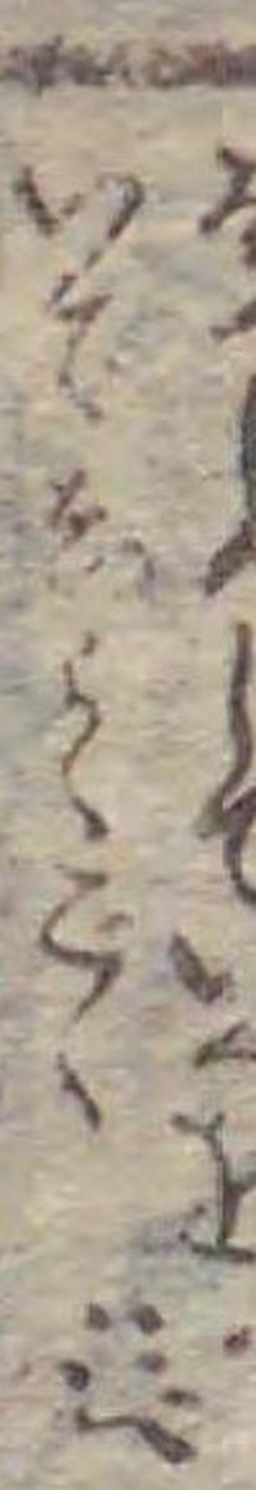いでしよこく
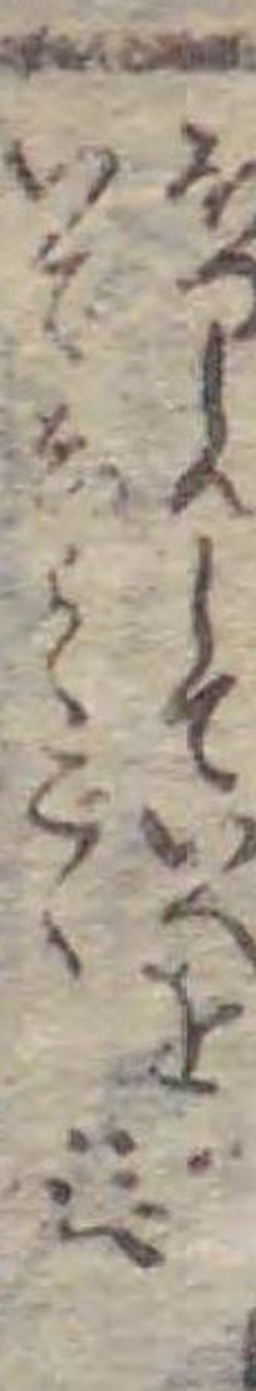いでしよこく
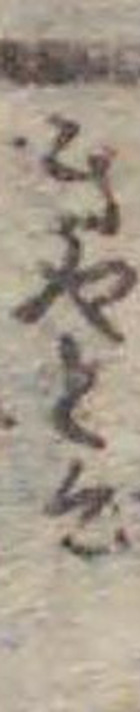きやと心
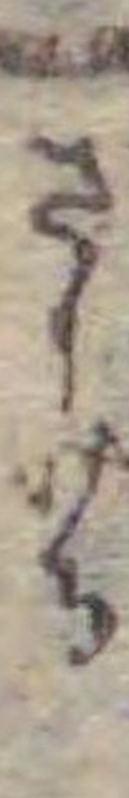さしける
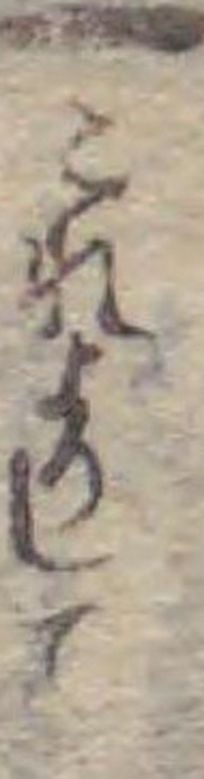これよりして
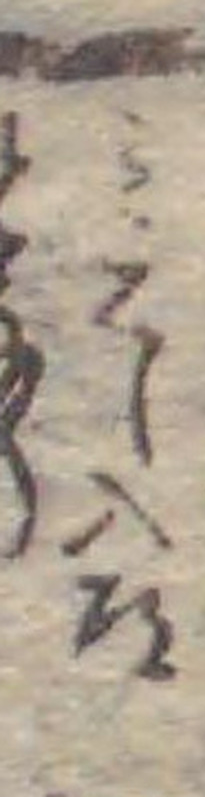となり
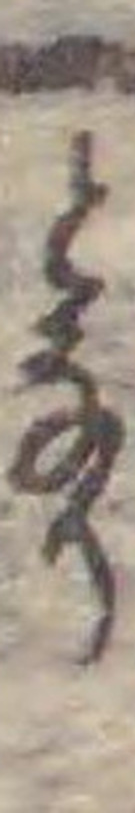となり
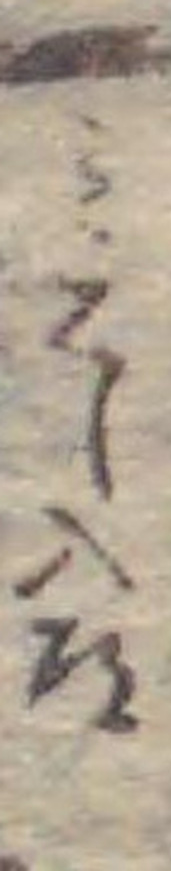みこし入道
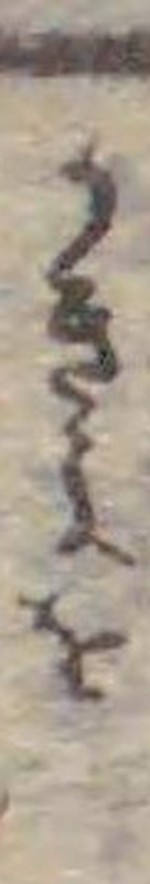うきよを
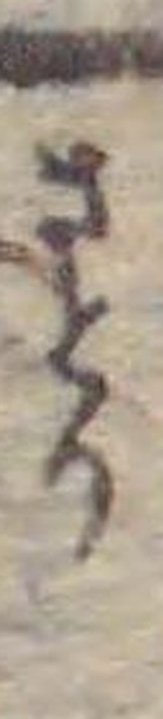さとり
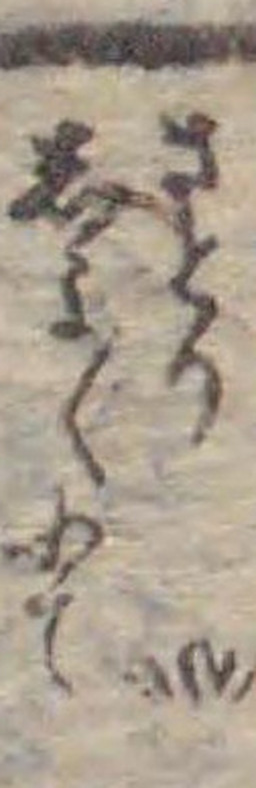しよ〳〵にて
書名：[化物一代記] : 5巻
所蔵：国立国会図書館 National Diet Library, JAPAN
